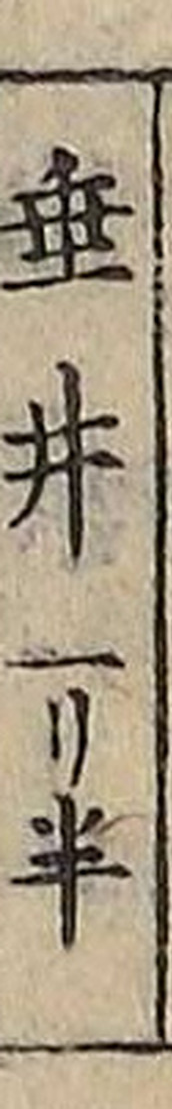垂井一リ半
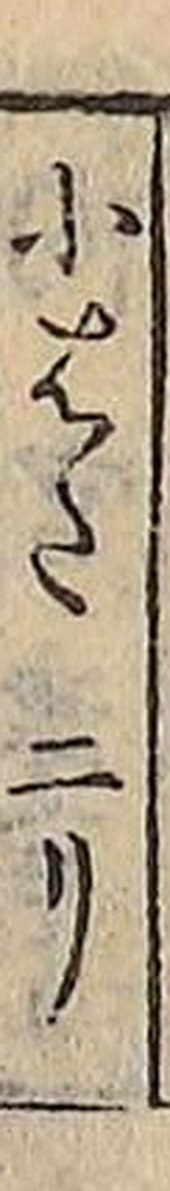小はた二リ
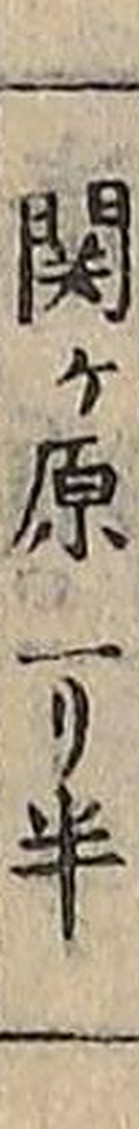関ケ原一リ半
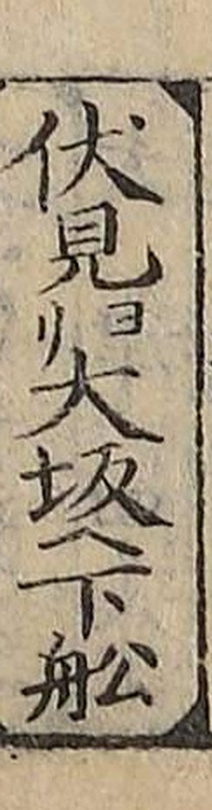伏見ヨリ大坂へ下船
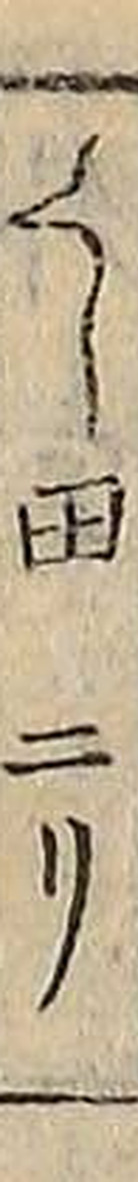くし田二リ
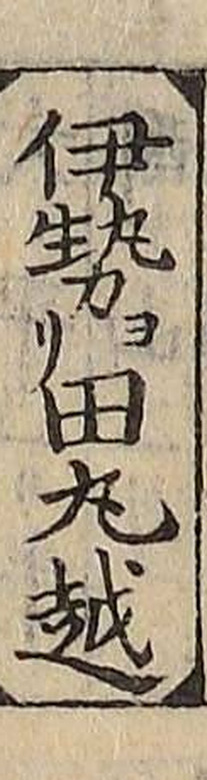伊勢ヨリ田丸越
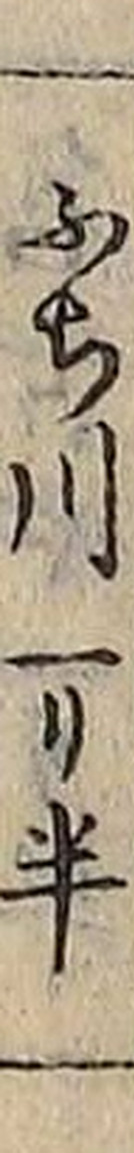ふち川一リ半
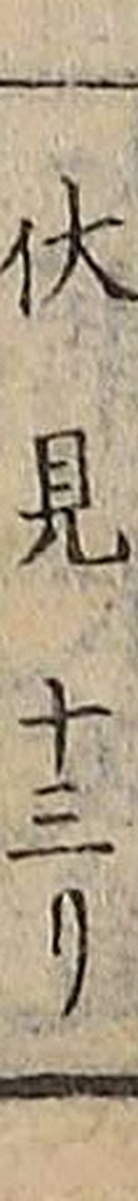伏見十三リ
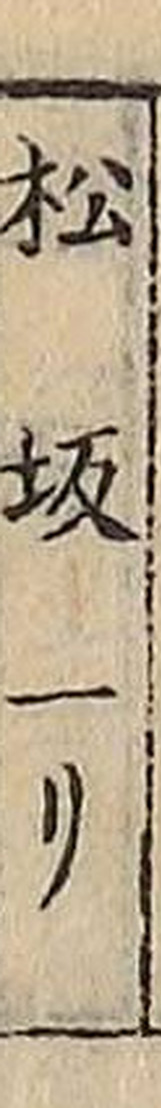松坂一リ
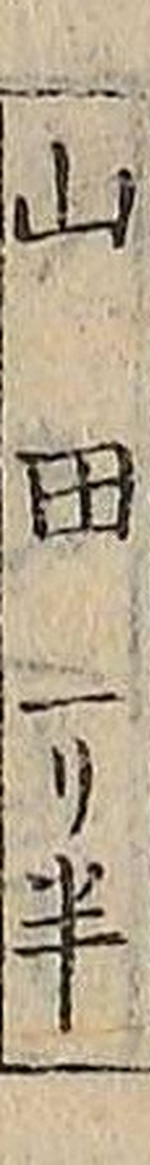山田一リ半
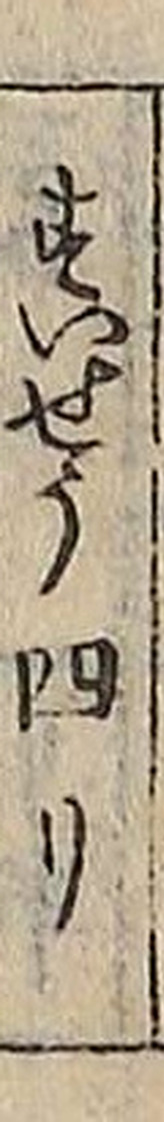すいせう四リ
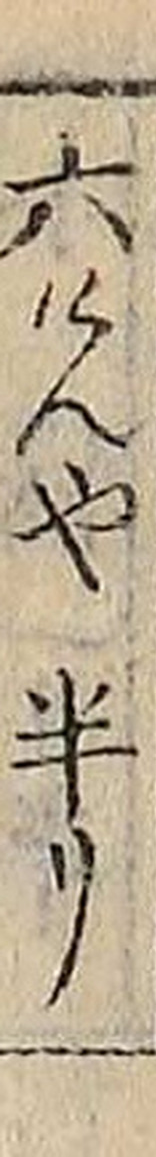六けんや半リ
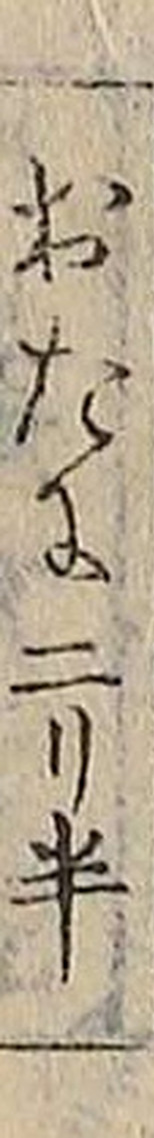おたに二リ半
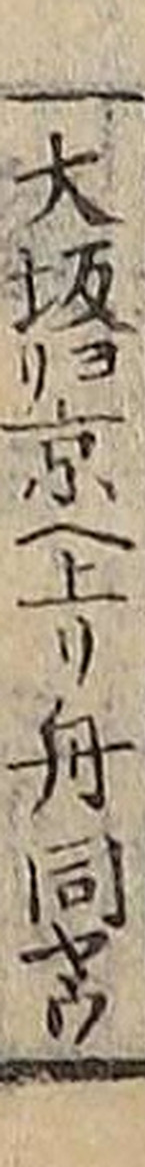大坂ヨリ京へ上リ舟同ヤウ
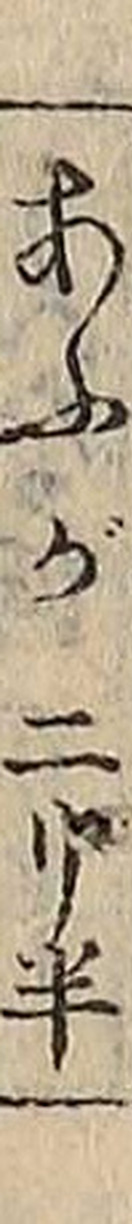あふが二リ半
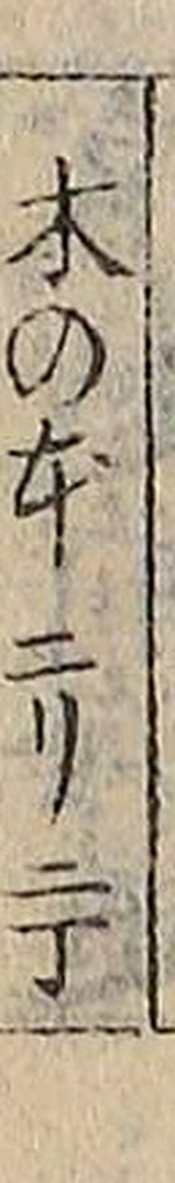木の本二リ二丁
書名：旅行用心集
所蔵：神戸大学附属図書館 国文学研究資料館
